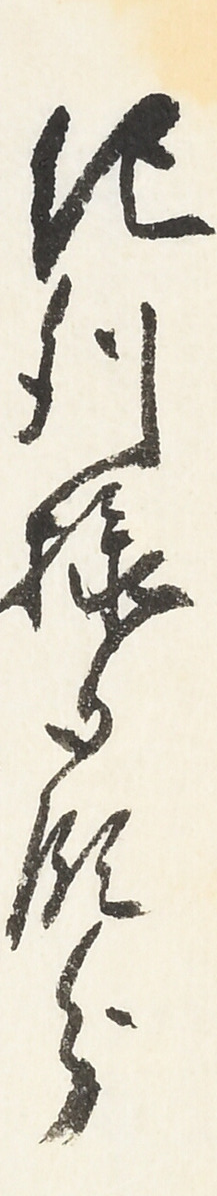紀州様御領分
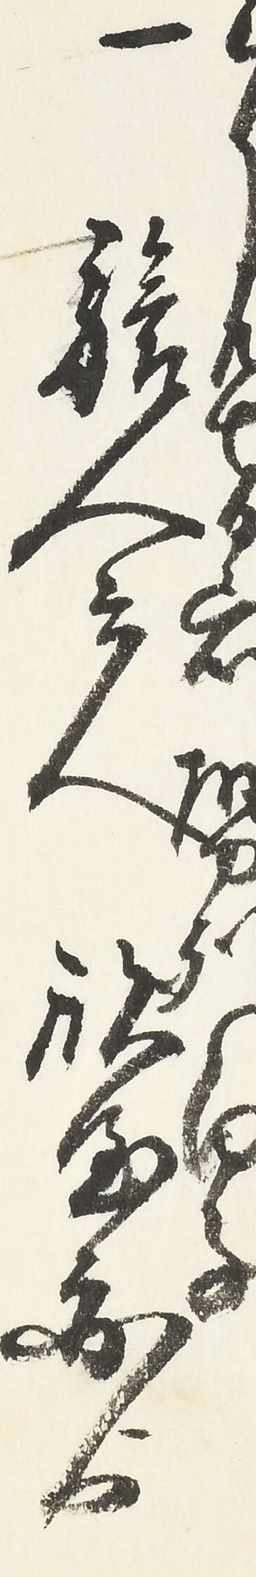一旅人壱人形屋亦衛門
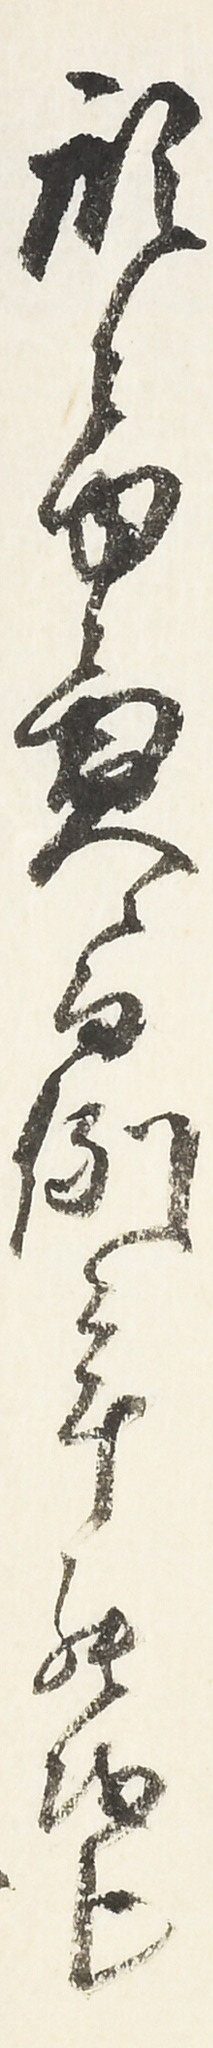形商売ニ而例年罷越申候
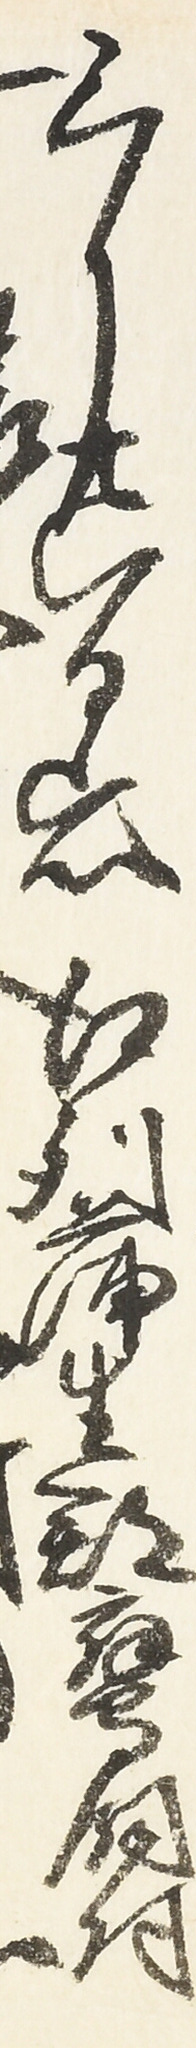三月廿八日着江州蒲生郡鷹飼村
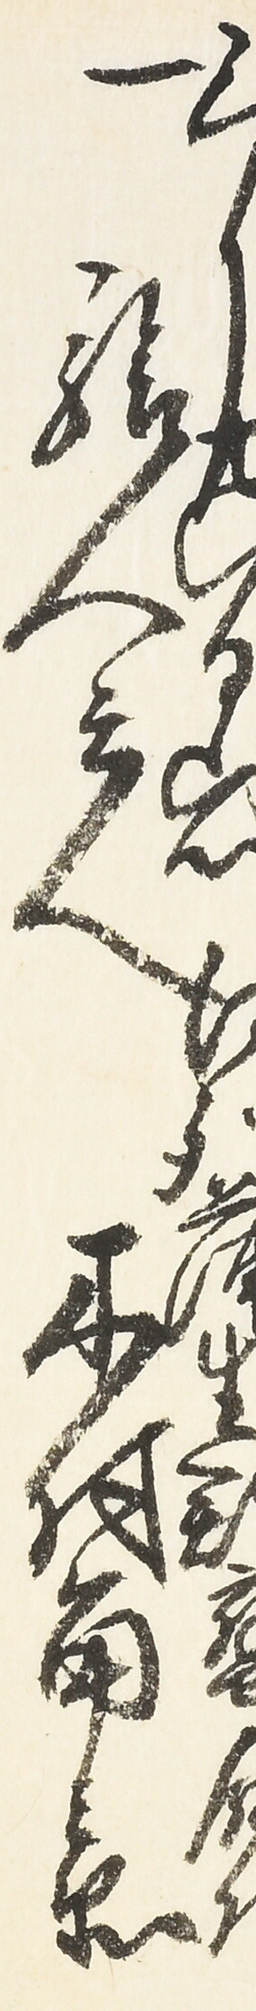一旅人壱人木村角兵衛
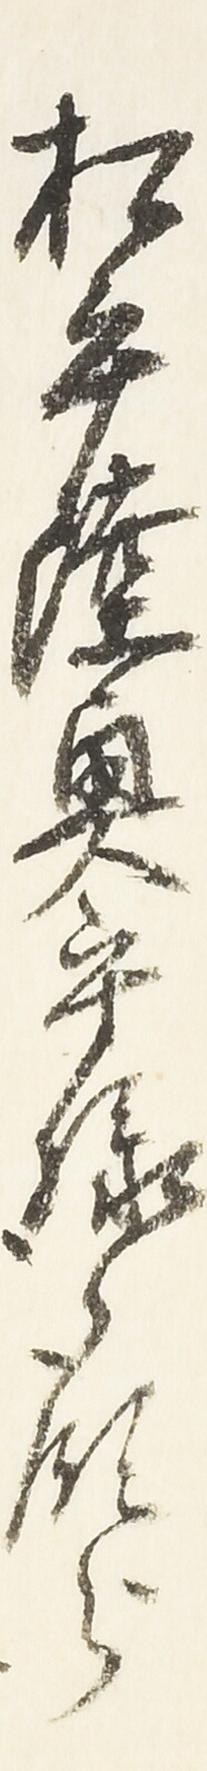松平陸奥守様御領分
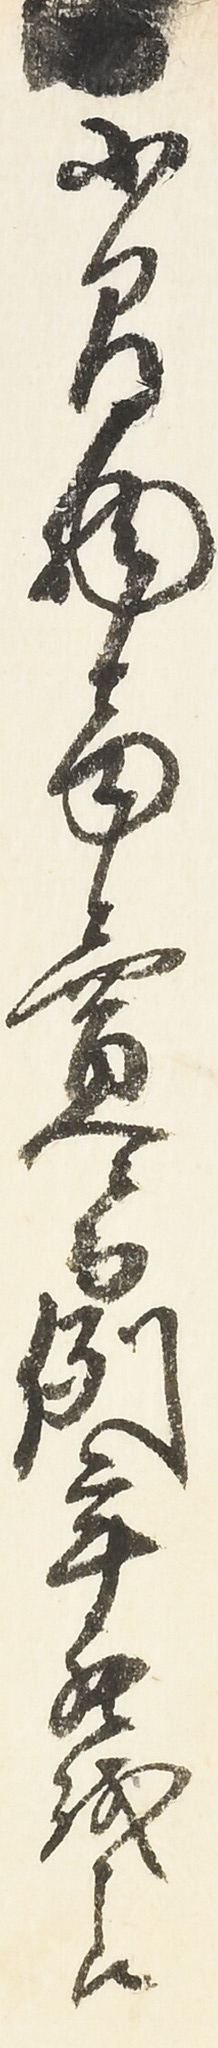小間物商売ニ而例年罷越申候
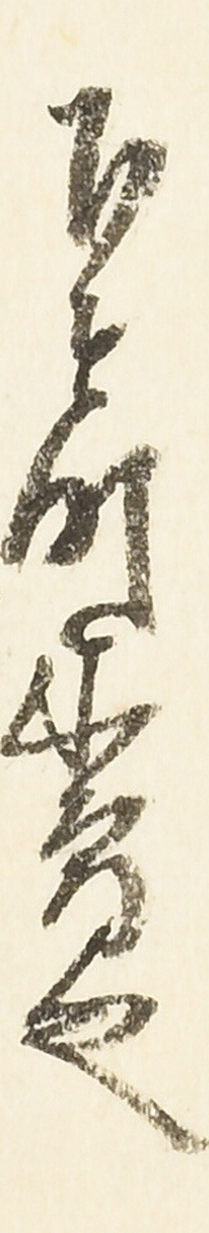下モ町木曽や
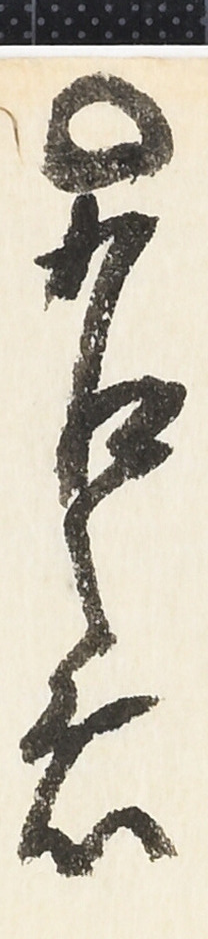〇右之者
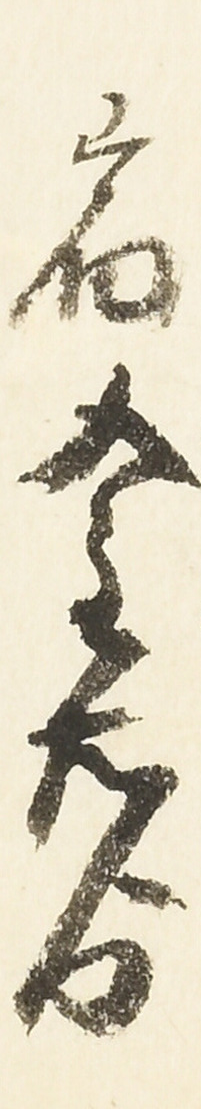宿金右衛門
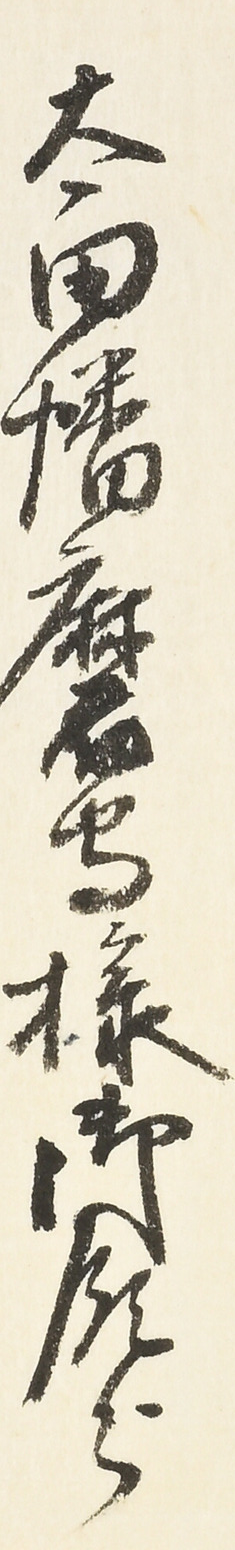太田播磨守様御領分
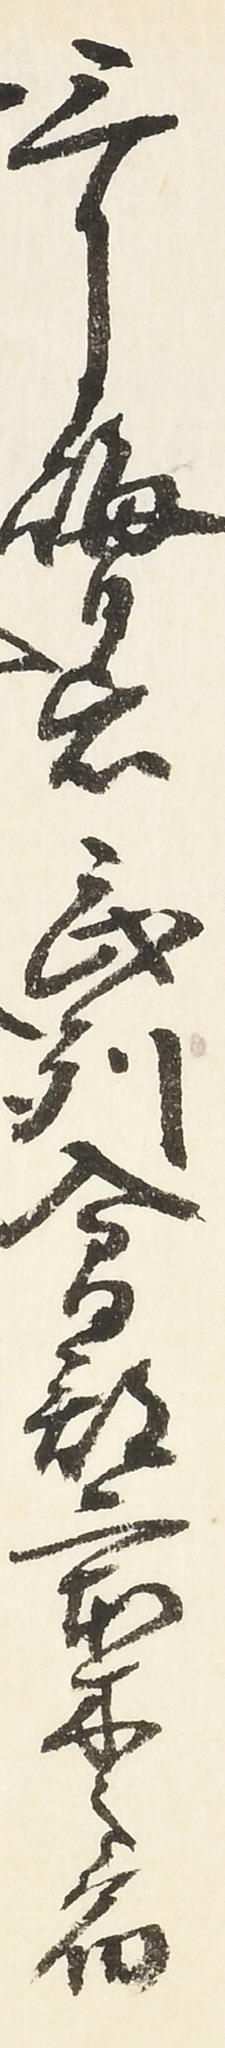三月晦日着武州入間郡二本木之宿
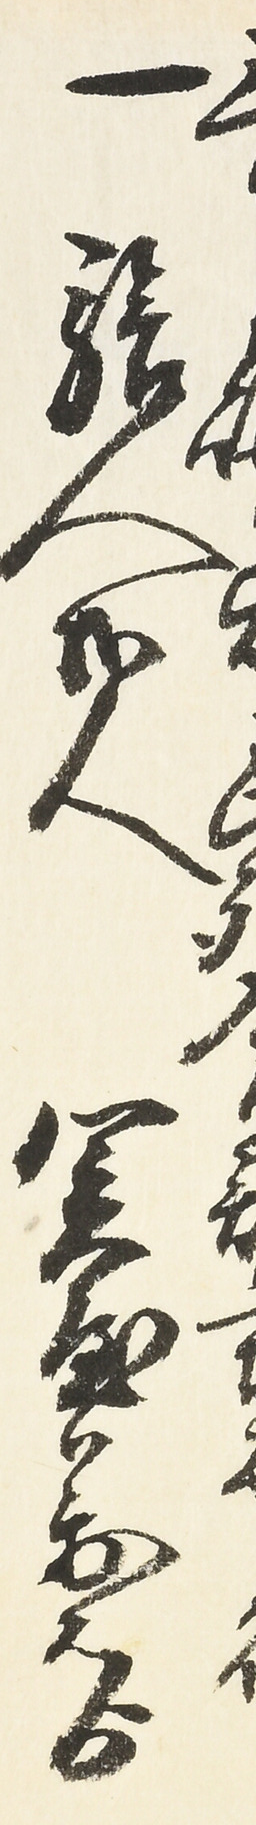一旅人弐人関屋万右衛門
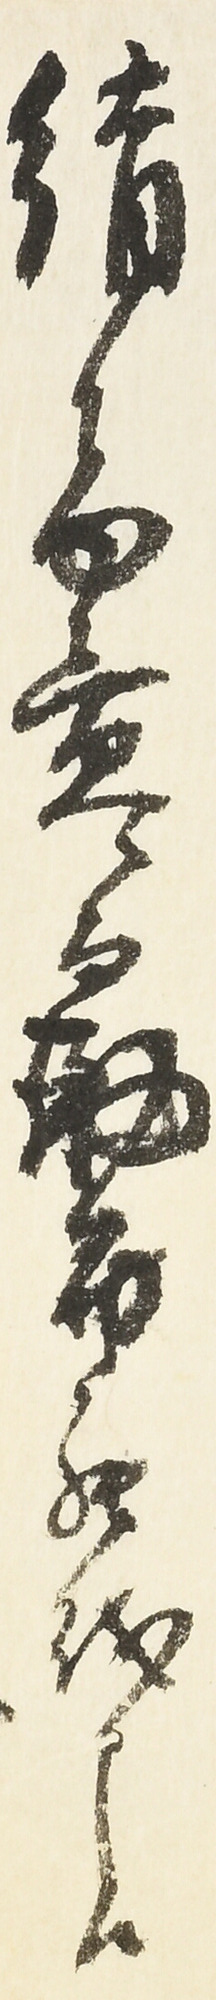絹商売ニ而初而罷越申候
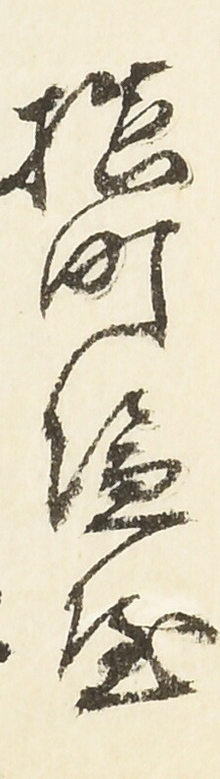横町塩屋
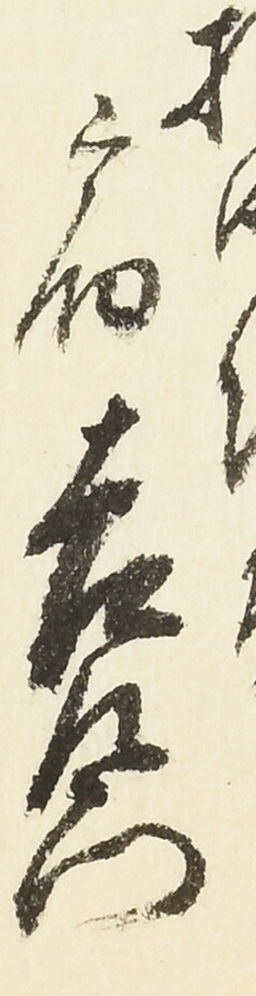宿吉左衛門
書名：町中旅人泊控帳
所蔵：伊那市立高遠町図書館・合同会社AMANE
